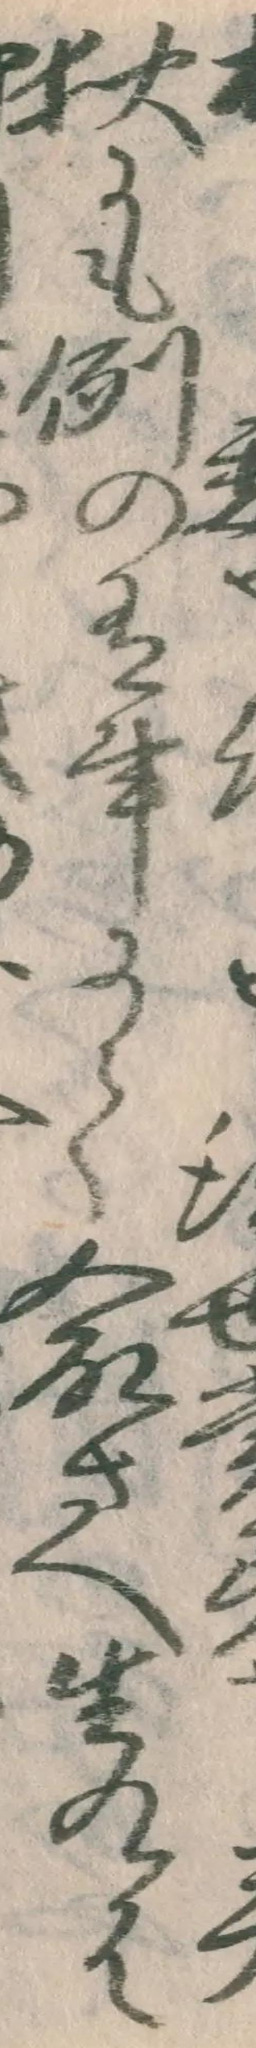狄にも例の有事にて命さへ生れは
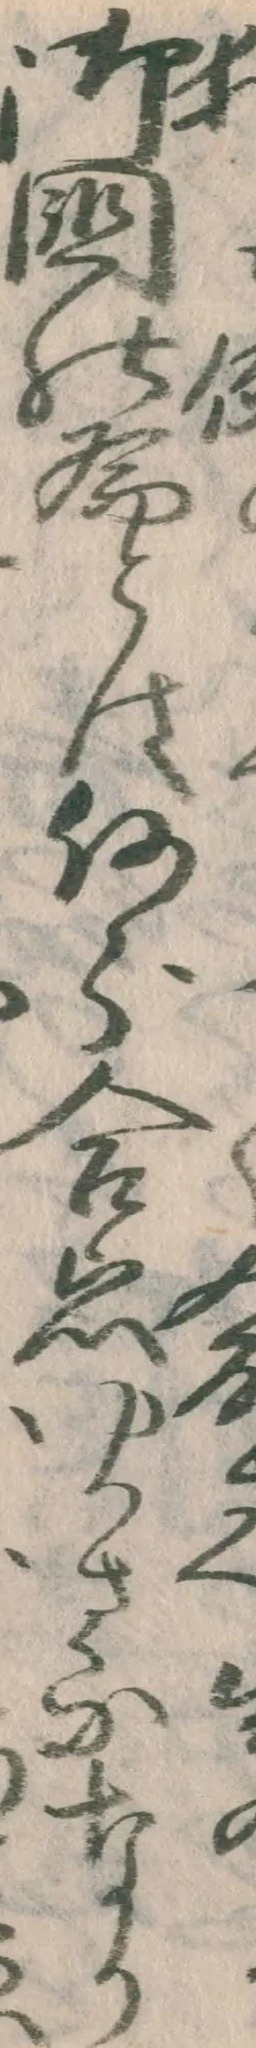御国の為とは何ら合点ゆかさるなり
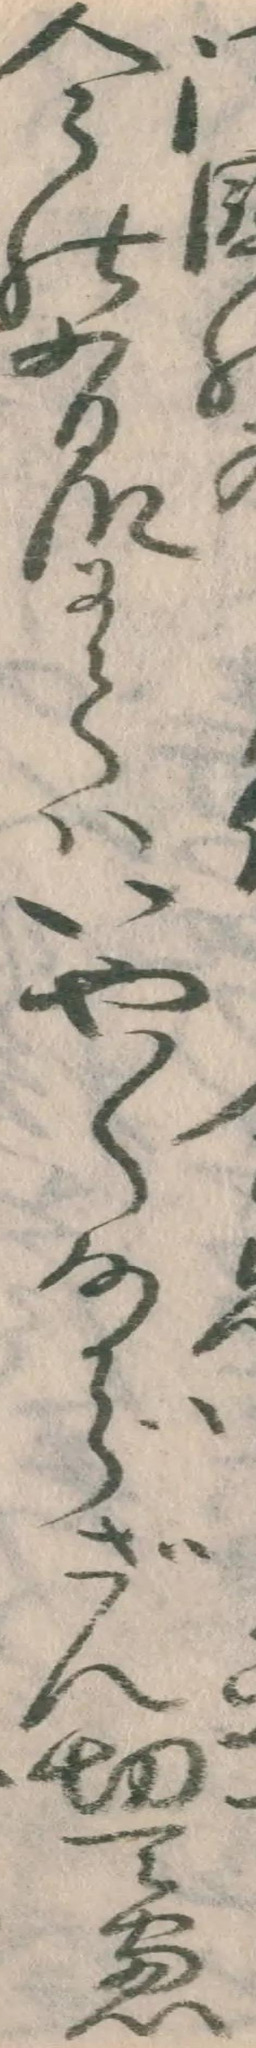今の有様にてハいや〳〵なからざん切天窓
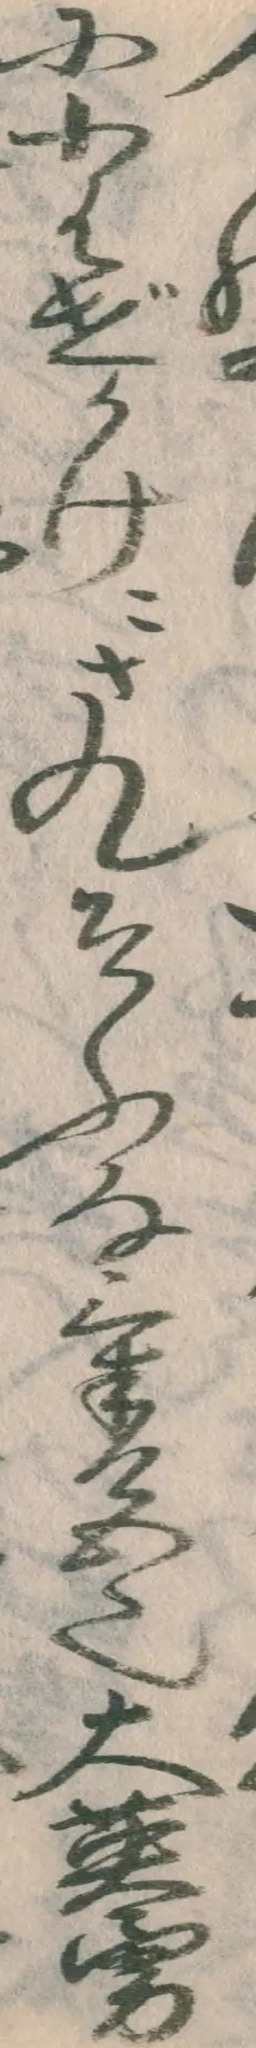に小はぜかけニされそふな氣色也大英勇
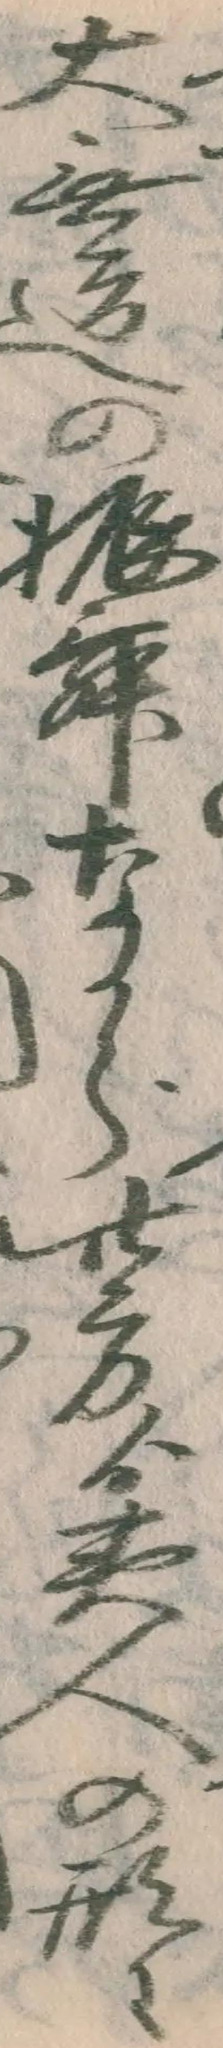大無道の振舞なから此方ゟ夷人の形に
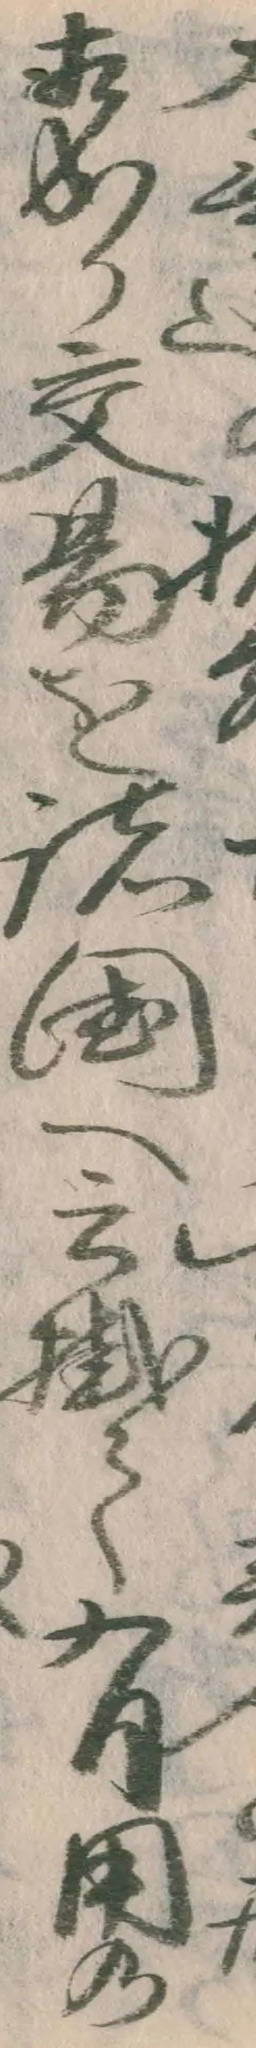相成り交易を諸国へ云掛て有用の
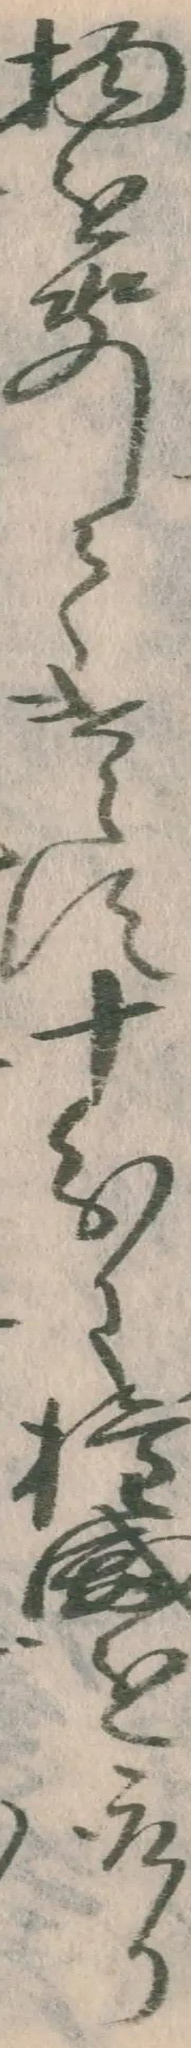物を決して遣さす十分に権威を取り
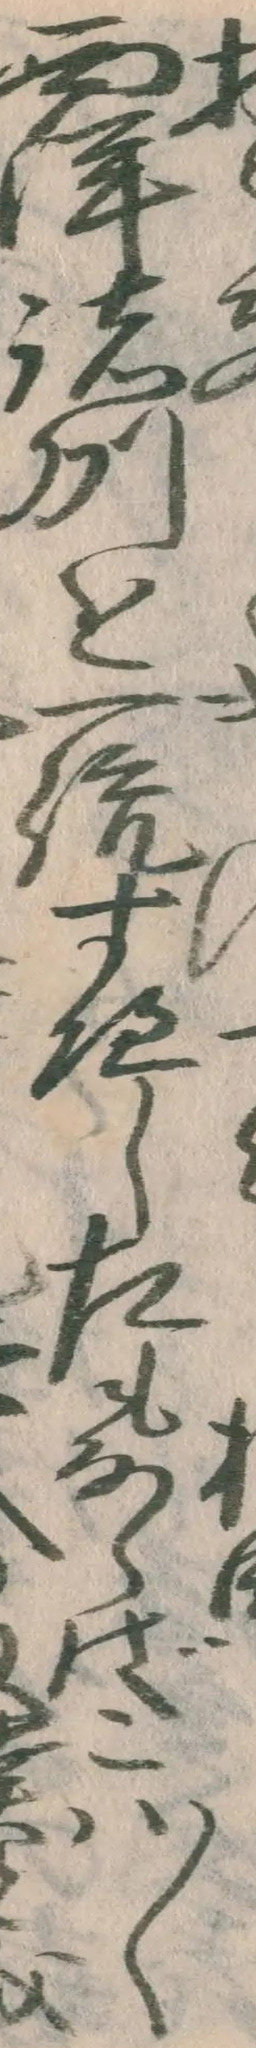西洋諸州と一統すへし左もなくばこハ〳〵
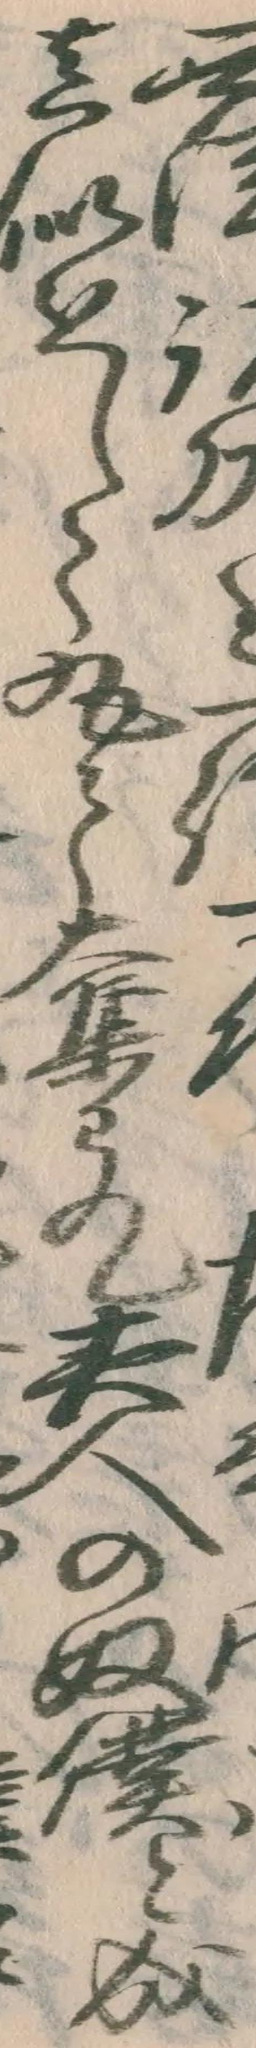真似をして丸て奪われ夷人の奴僕と成
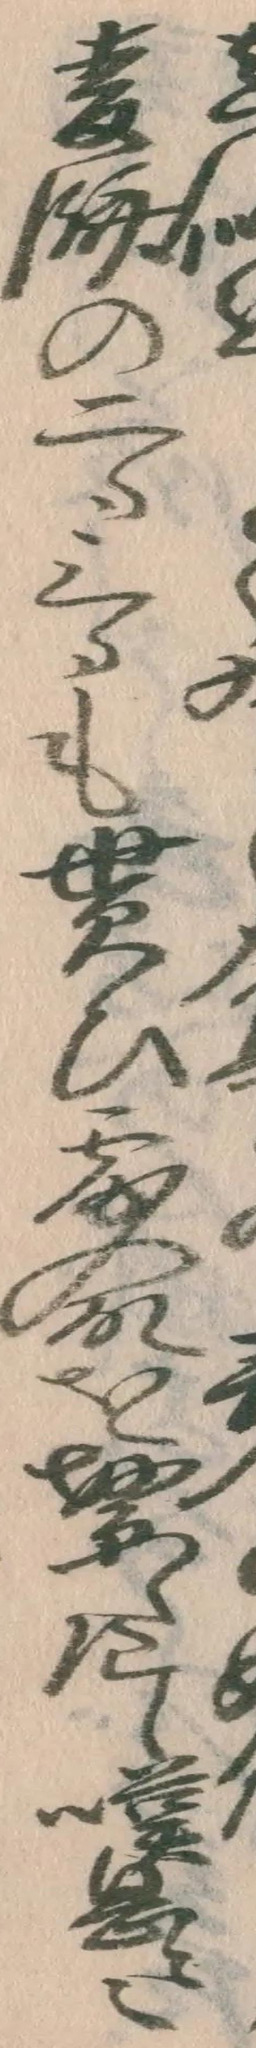麦餅の二ツ三ツも貰ひ露命を繋くへし嘆息々々

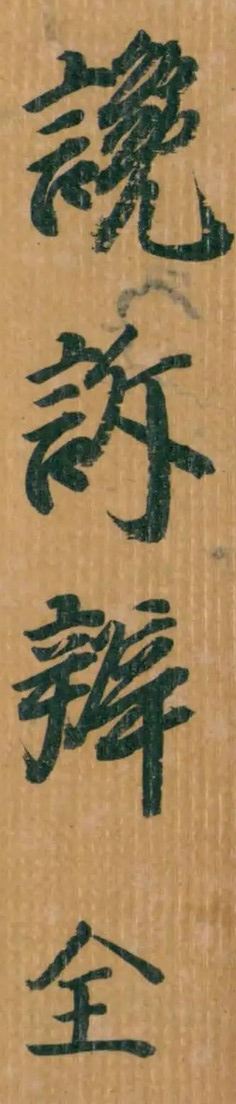讒訴辨全

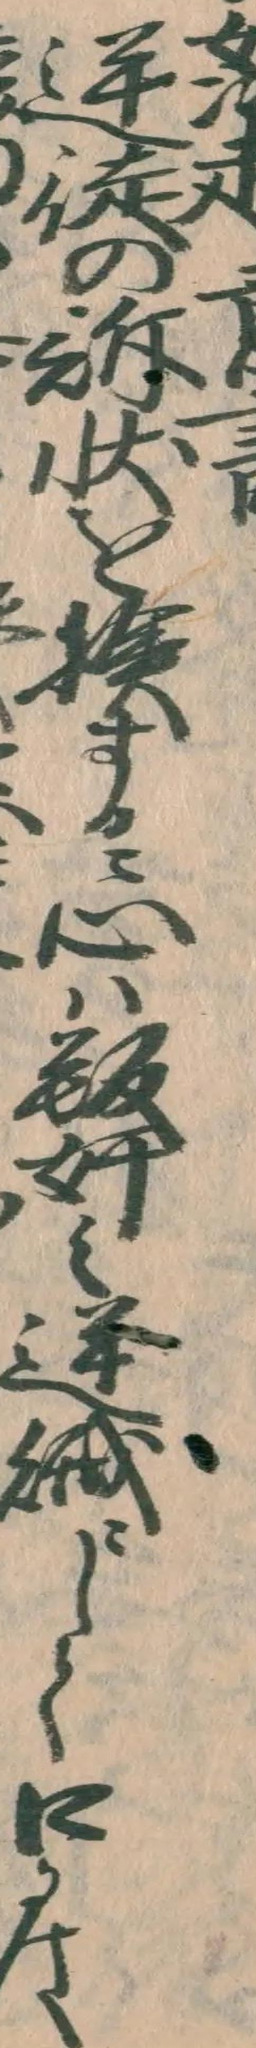逆徒の訴状を検するニ心ハ叛奸之逆賊ニして口には
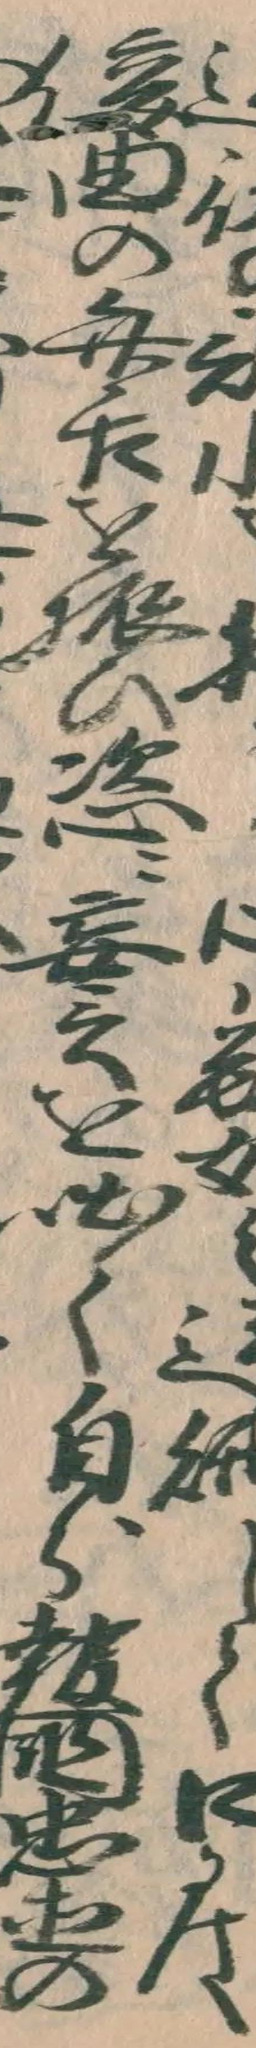佞曲の弁舌を振ひ恣ニ妄言を咄て自ら報国忠直の
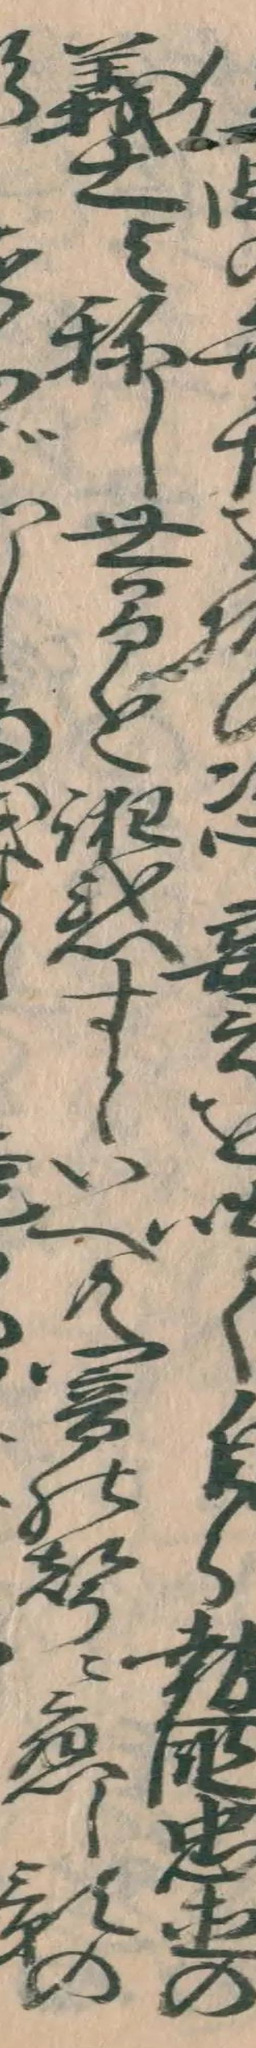義士と称し世間を誑惑すといへ共闇の聲ニ應し影の
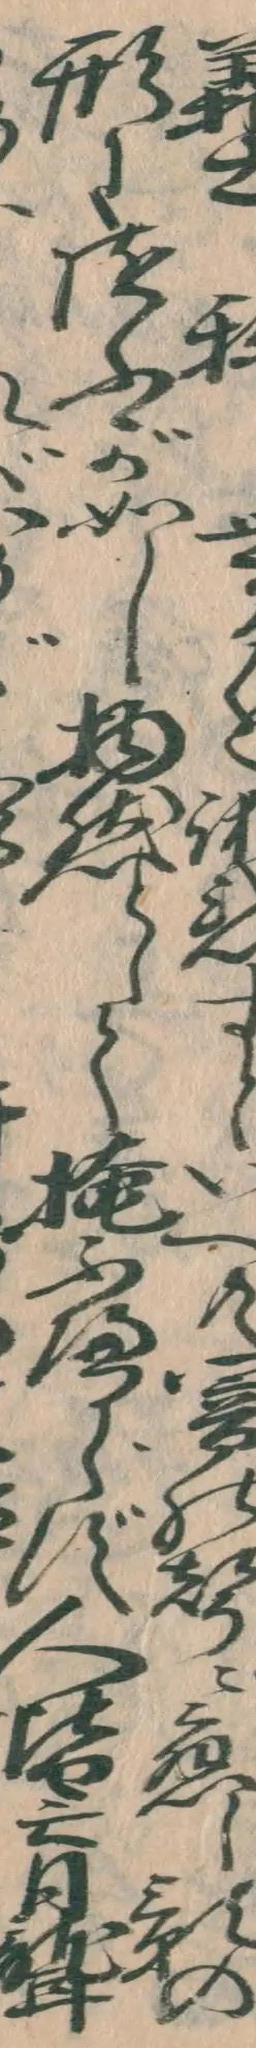形に随ふが如し物然として掩ふへからず人皆盲聾
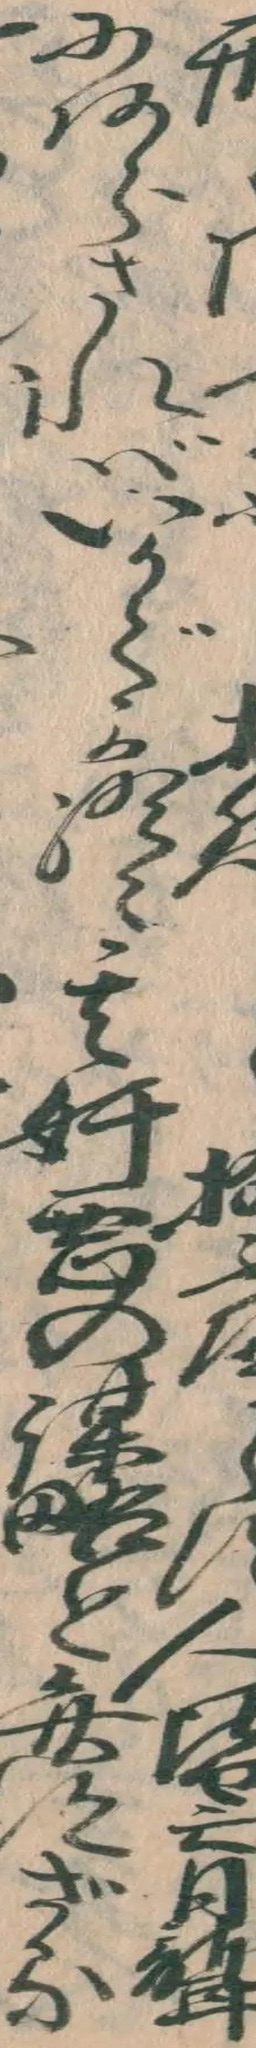にあらされバいかでか終ニ其奸悪の謀略を弁得ざる
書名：麗斎叢書. 20
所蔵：国立国会図書館 National Diet Library, JAPAN
